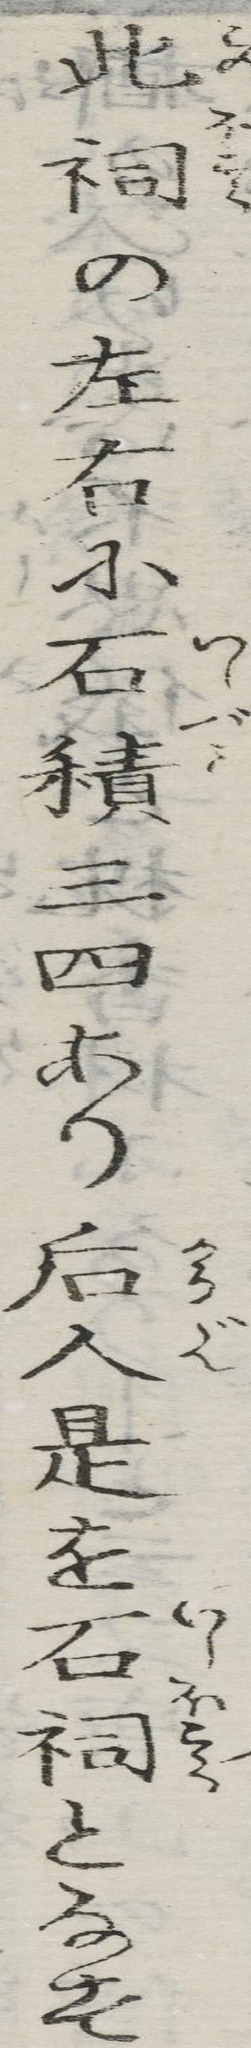此祠の左右に石積三四あり后人是を石祠となす
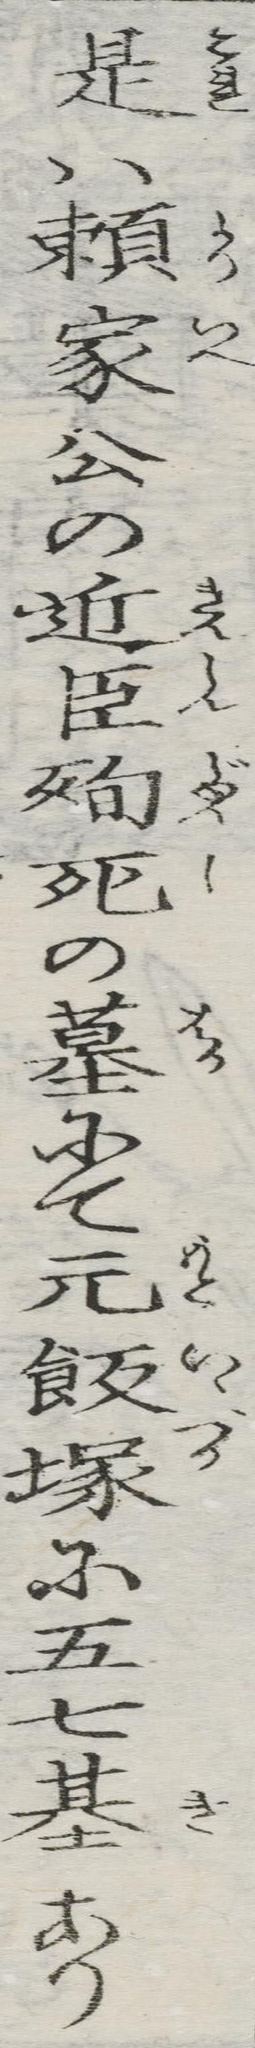是は頼家公の近臣殉死の墓にて元飯塚に五七基あり
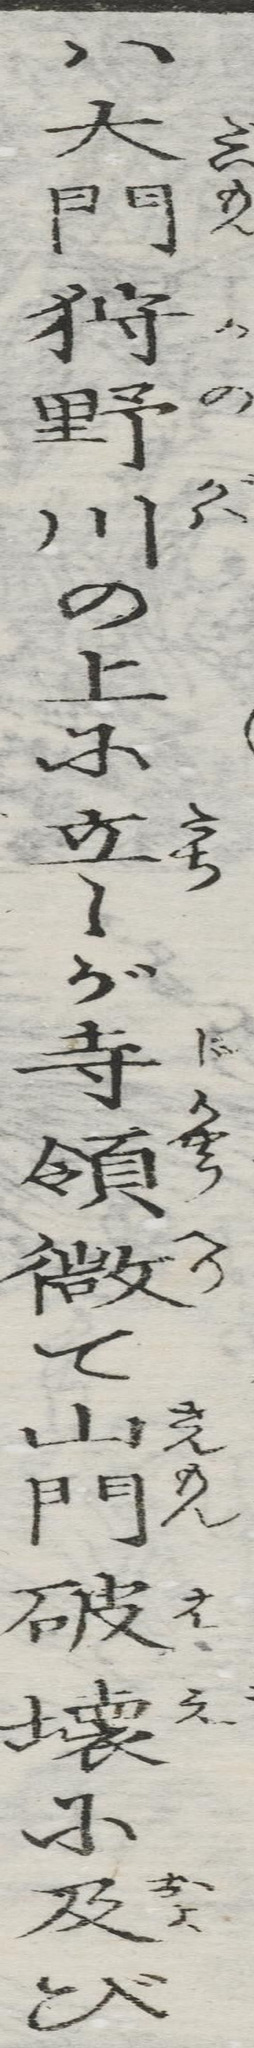は大門狩野川の上に立しが寺領微て山門破壊に及び
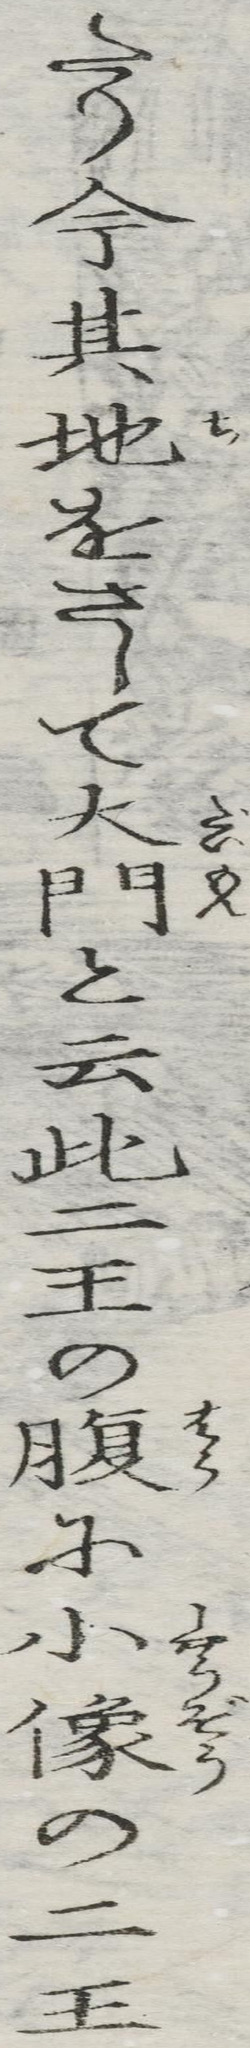たり今其地をさして大門と云此二王の腹に小像の二王
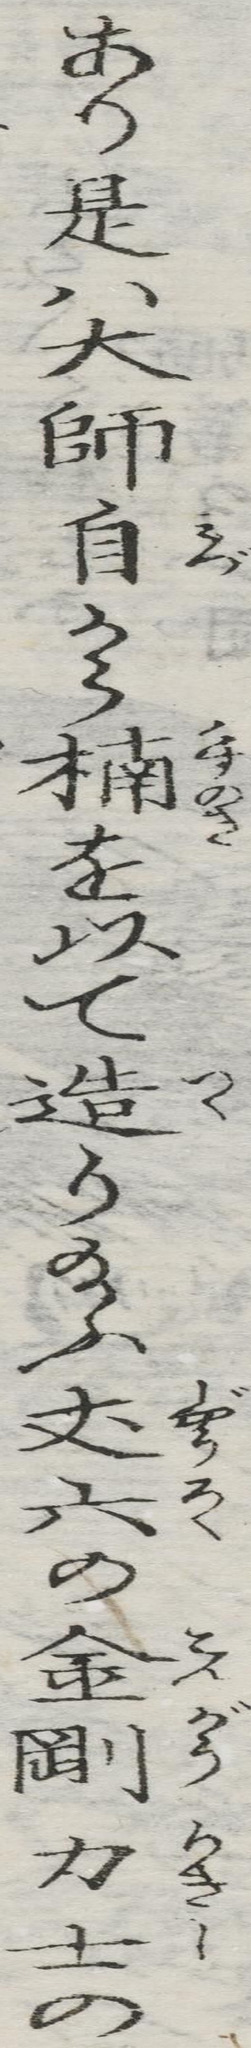あり是は大師自から楠を以て造り給ふ丈六の金剛力士の
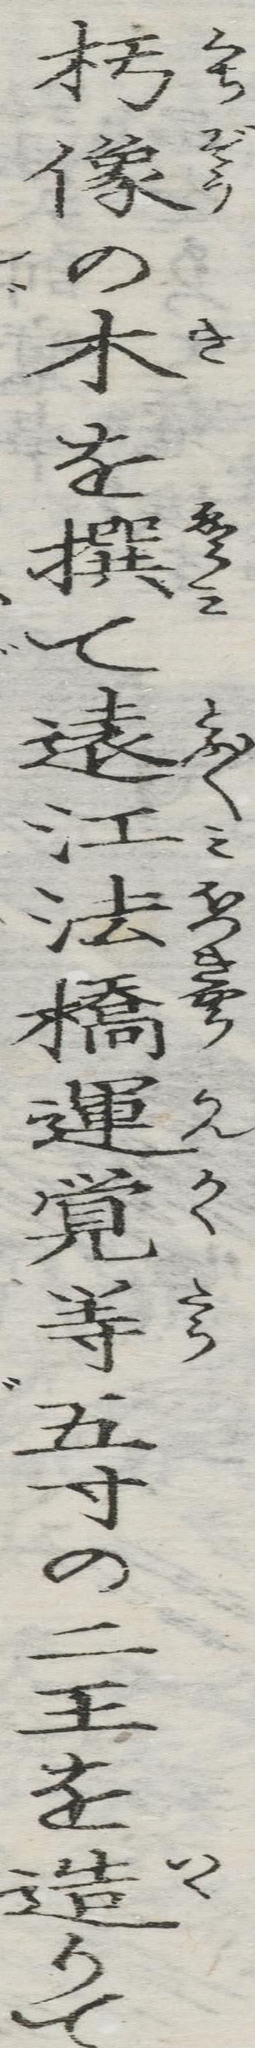朽像の木を撰て遠江法橋運覚等五寸の二王を造りて
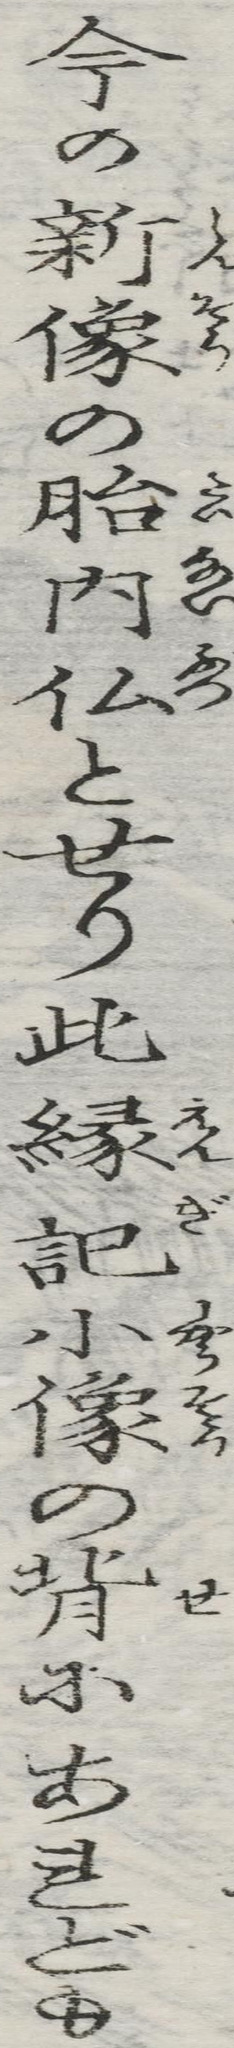今の新像の胎内仏とせり此縁記小像の背にあれども

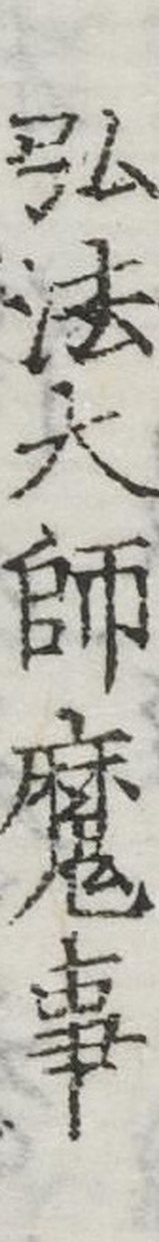弘法大師魔事
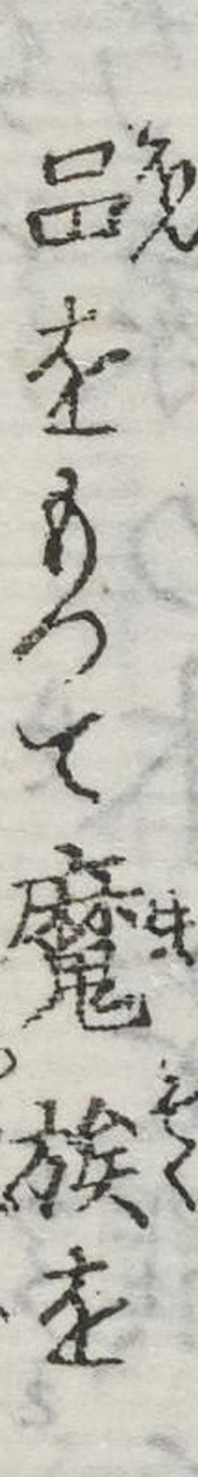品をもつて魔族を
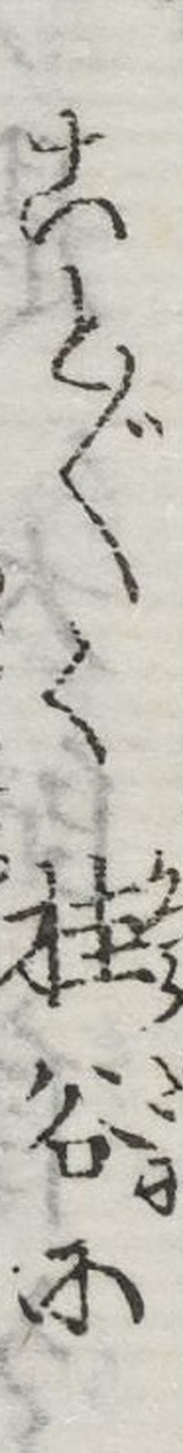こと〴〵く桂谷に

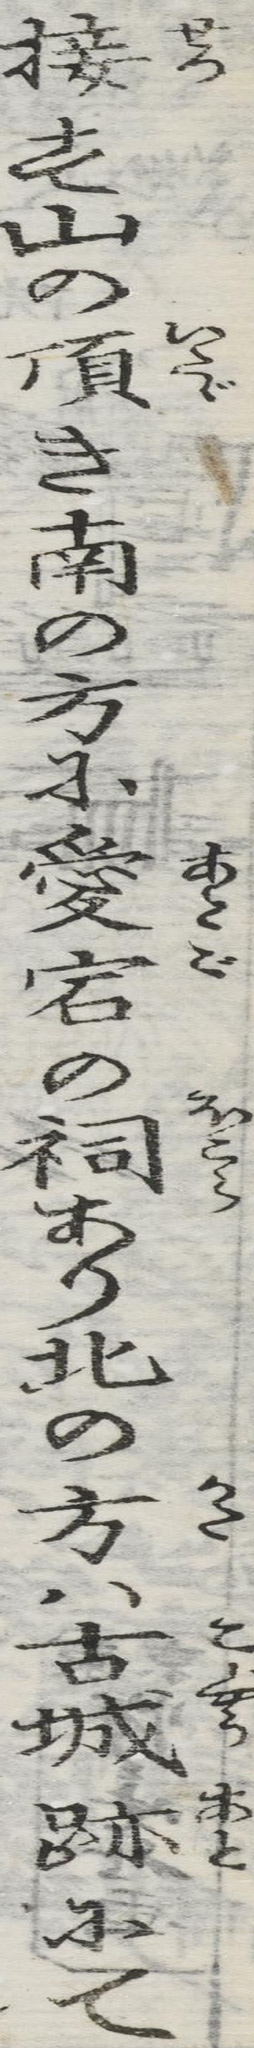接す山の頂き南の方に愛宕の祠あり北の方ハ古城跡にて
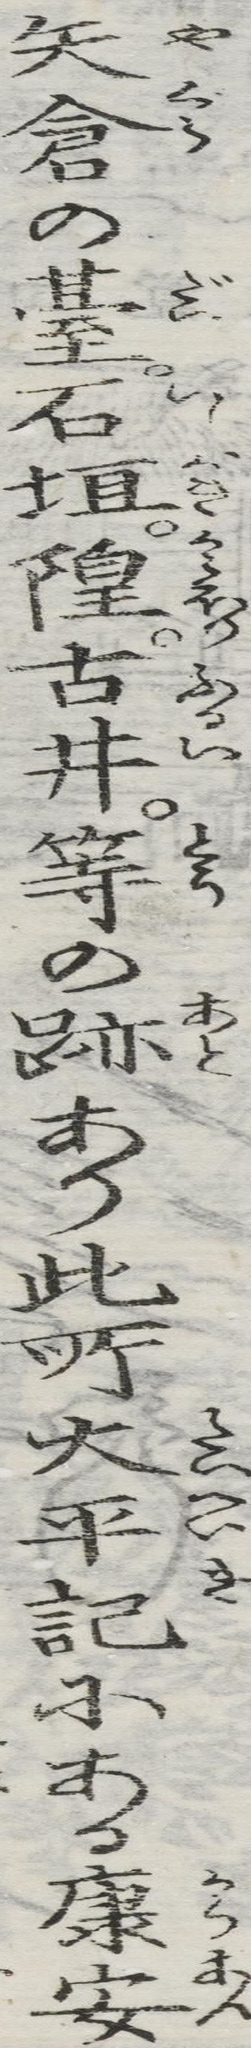矢倉の臺。石垣。隍。古井。等の跡あり此所太平記にある康安
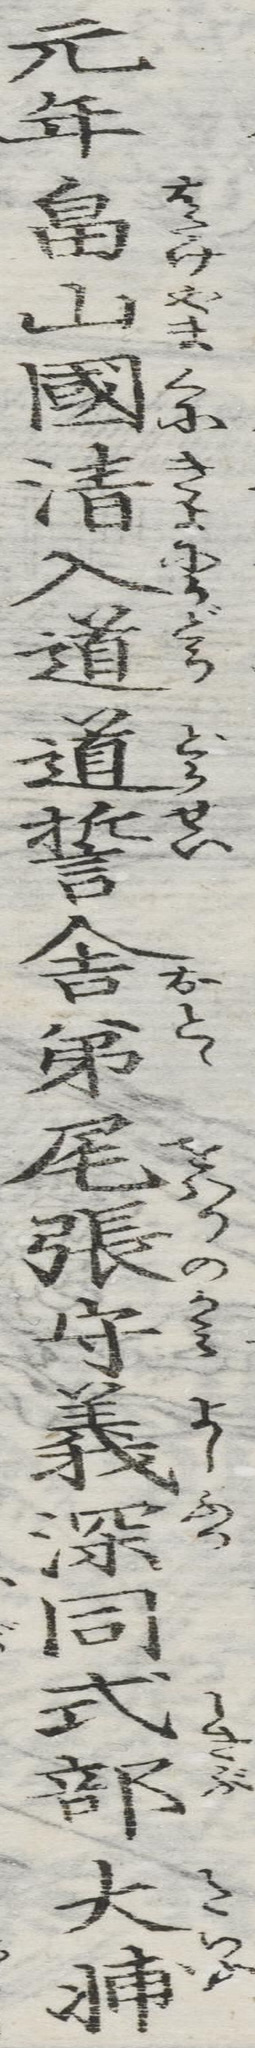元年畠山國清入道道誓舎弟尾張守義深同式部大捕
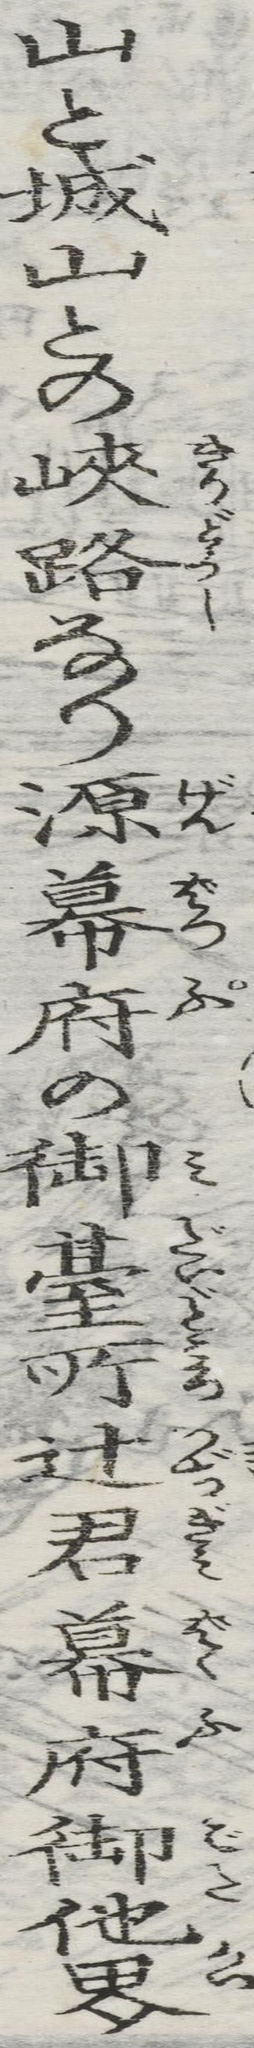山と城山との峡路なり源幕府の御臺所辻君幕府御他界
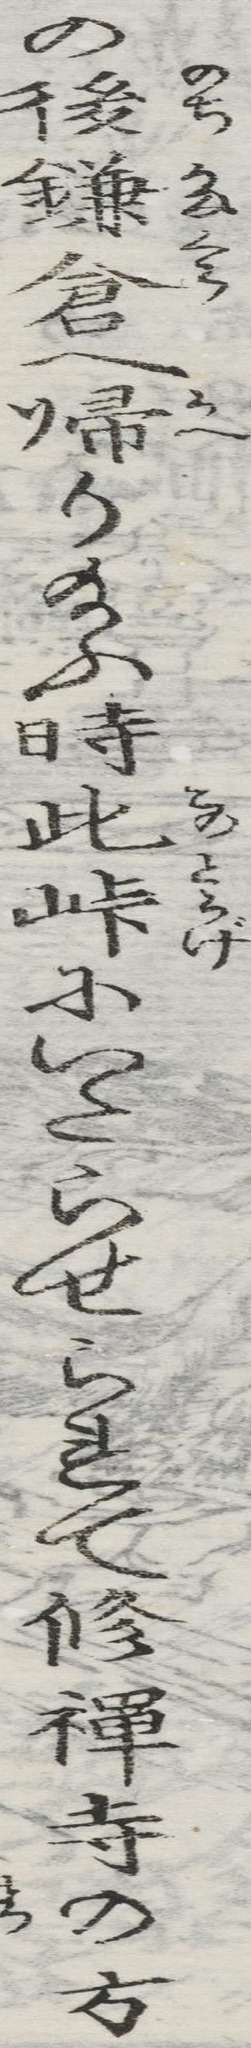の後鎌倉へ帰り給ふ時此峠にいたらせられて修禅寺の方
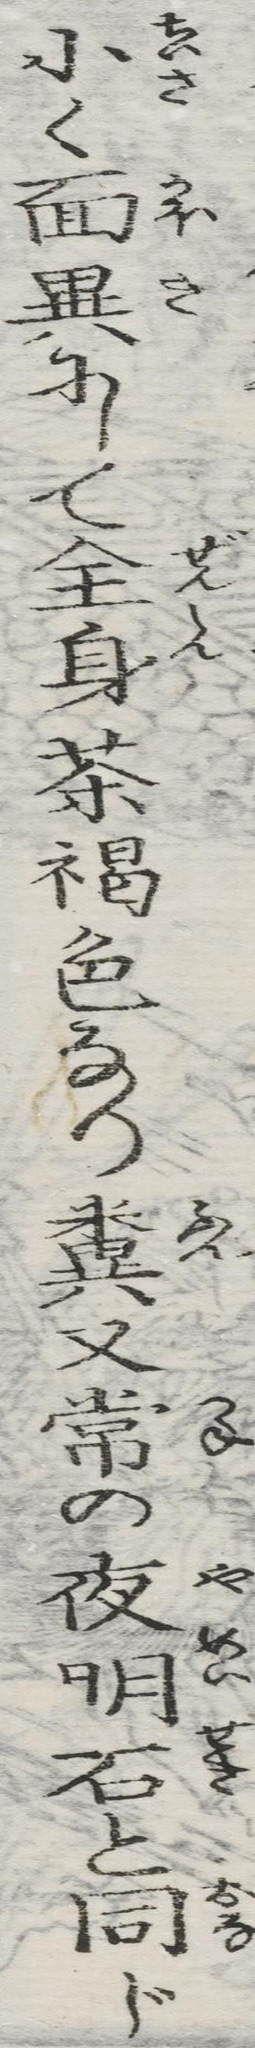小く面異にして全身茶褐色なり糞又常の夜明石と同じ
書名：伊豆国修善寺温泉名所記　全
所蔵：東京大学地震研究所図書室 Earthquake Research Institute Library, The University of Tokyo, JAPAN
